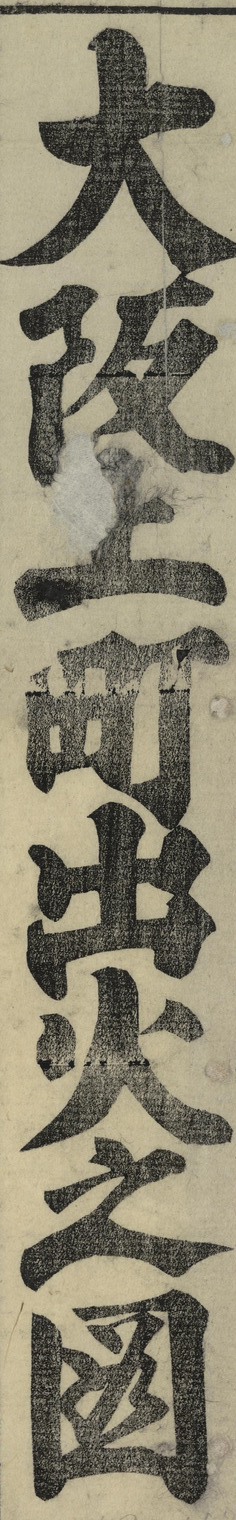大阪上町出火之図
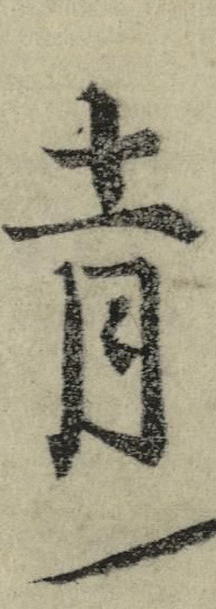十一月
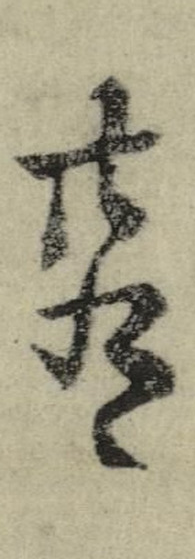廿九日
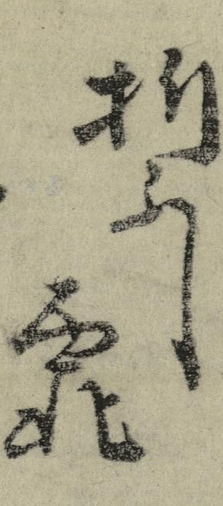折ふし西北
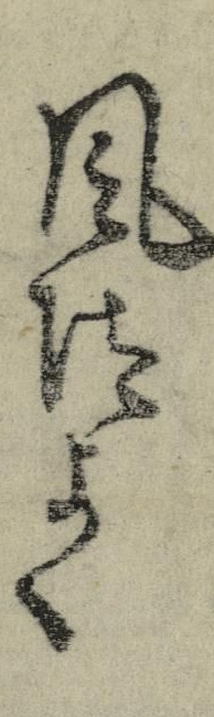風つよく
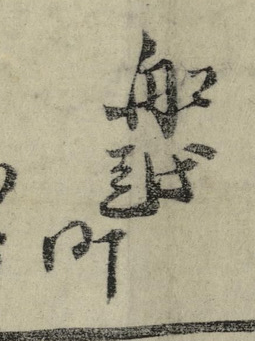船越町
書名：大阪上町出火之図
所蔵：東京大学地震研究所図書室 Earthquake Research Institute Library, The University of Tokyo, JAPAN
